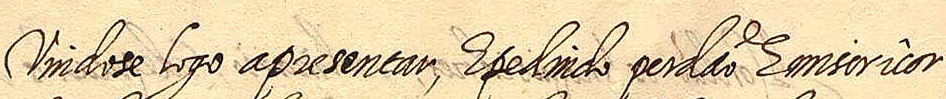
Vindose logo apresentar, E pedindo perdaõ E misericor
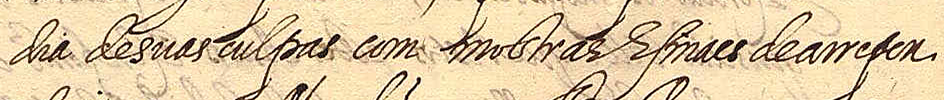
dia de suas culpas com mostras E sinaes de arrepen
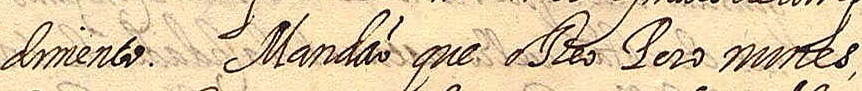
dimento. Mandaõ que o Reo Pero nunes,
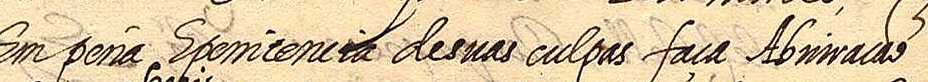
Em pena E penitencia de suas culpas faça Abiuraçaõ
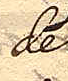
de
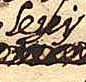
leuy
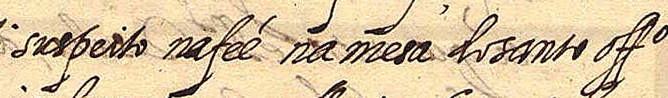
suspeito na feé na mesa do santo offo
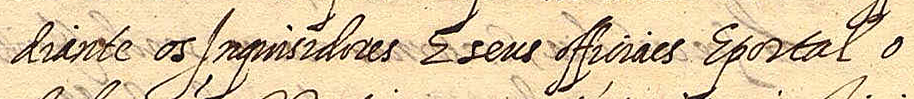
diante os Jnquisidores E seus officiaes E por tal o
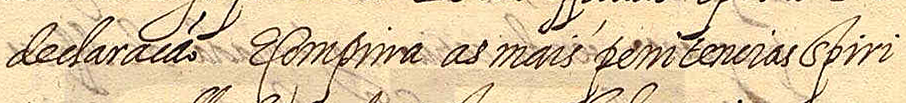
declaração E Comprira as mais penitencias spiri
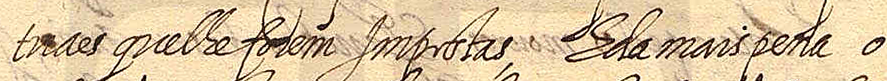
tuaes que lhe forem Jmpostas, E da mais pena o
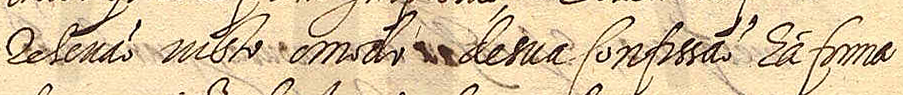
Releuaõ uisto o modo de sua Confissaõ E á forma
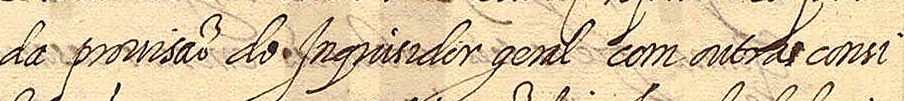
da prouisaõ do Jnquisidor geral com outras consi
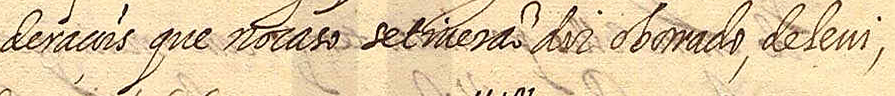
deraçoĩs que no caso se tiueraõ diz o borrado, de leui,
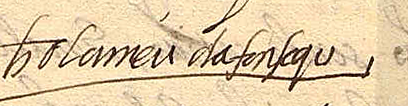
b̄olameu da fonseqa
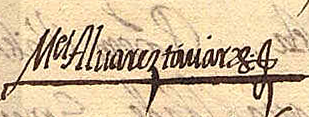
Mel Aluarez tauares
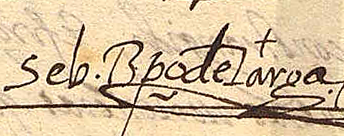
Seb. Bpo de Targa
